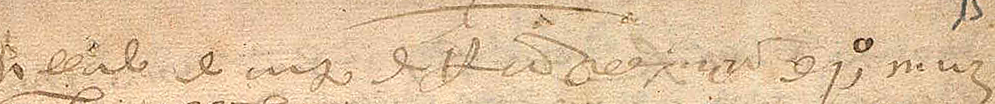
trellado do auto de Rcōcilljaçā de po nunz
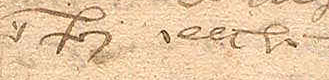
q̄ foj ellche
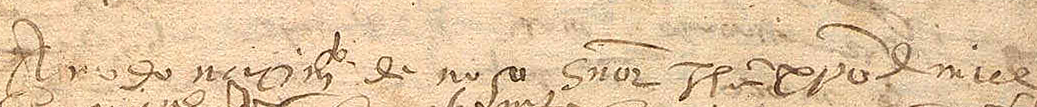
Ano do nacimto de noso Sn̄or Jhū xp̄o de mill
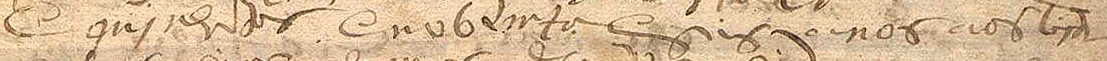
e qujnhētos e noventa e seis anos aos vj̄te
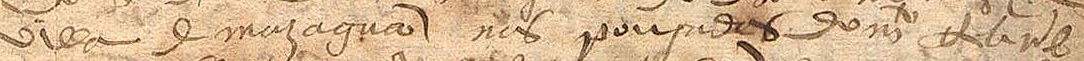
villa de mazaguão nas pousadas do mto Reverēdo
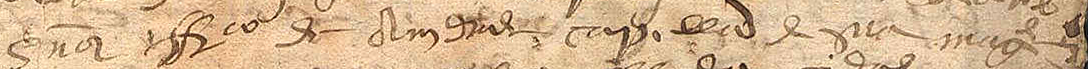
Sn̄or ffrco de Amdrade capellā de sua magde
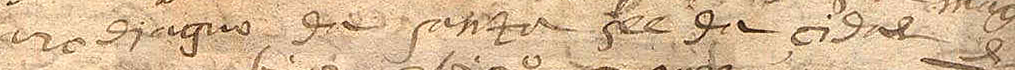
arcdiaguo da santa see da cidade de
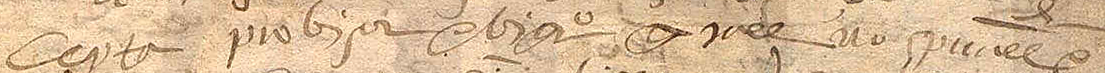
Cepta provizor e vigro gerall no spūall e
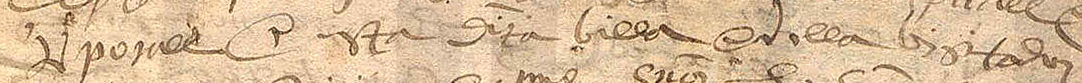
tēporall ē esta dita villa e ē ella visitador
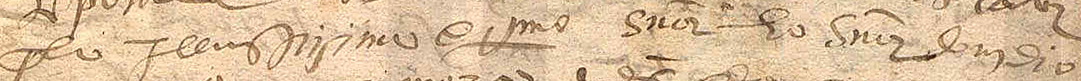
p̄lo Jllustrisimo e Rmo sn̄or ho Sn̄or dom dio
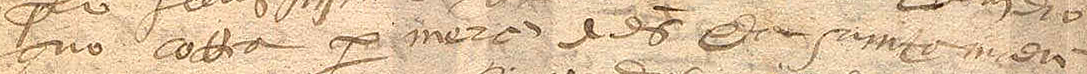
guo coRea ꝑ merçe de ds̄ e da samta madre
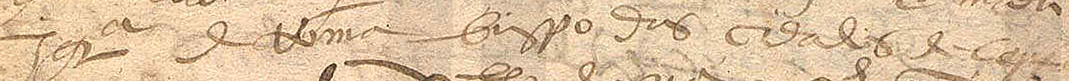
Jgra de Roma bispo das cidades de cepta
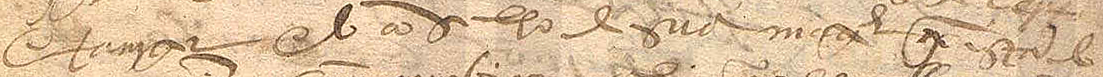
e tamger e do c̄oselho de sua magde q̄ estādo
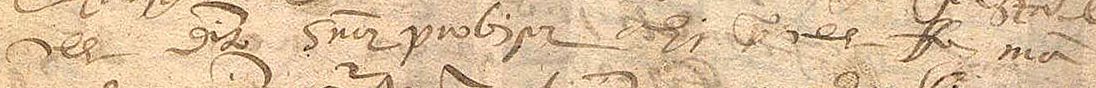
elle dito sn̄or provisor ahi p̄o elle ffoi mā
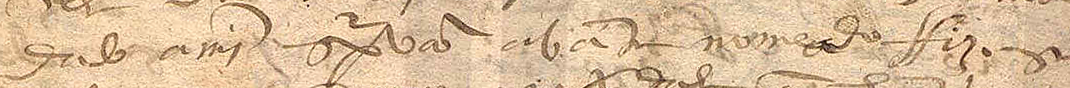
dado a mj̄ esp̄vaõ avāte nomeado fizese
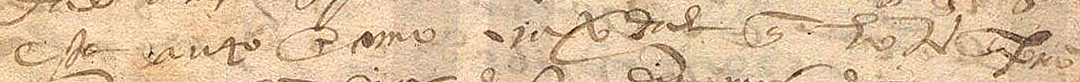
este auto ē como era ꝟdade q̄ hōtē q̄ forō
